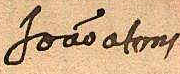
João atems
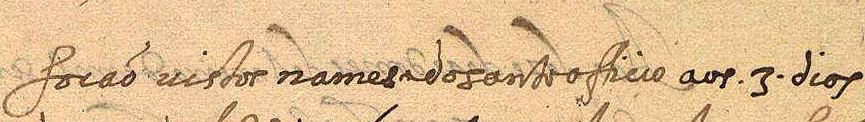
foraõ uistos na mesa do santo officio aos 3. dias
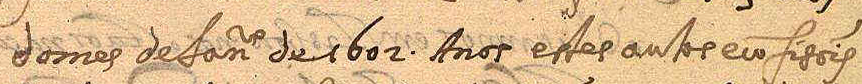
do mes de Ian.ro de 1602. Anos estes autos e cōfisoĩs
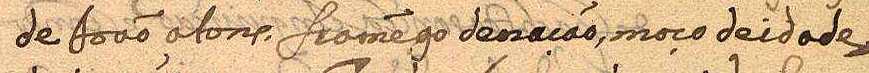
de Ioaõ atons framēgo de naçaõ, moço de idade
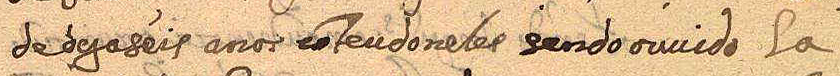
de dezaseis anos cōteudo neles sendo ouuido E a
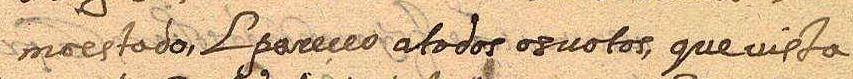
moestado, E pareceo a todos os uotos, que uista
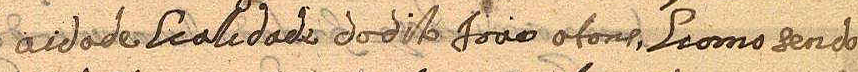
a idade E calidade do dito João atons, E como sendo
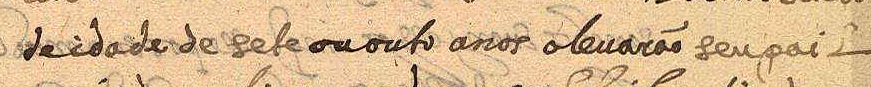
de idade de sete ou outo anos o leuaraõ seu pai E
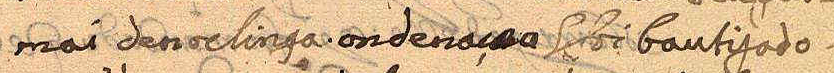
mai de norlinga onde naceo E foi bautizado
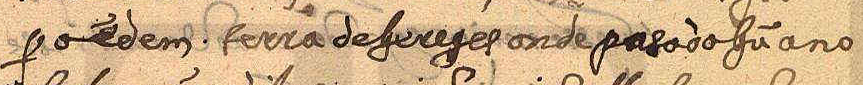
ꝑo ēdem. terra de hereges onde pasado hū ano
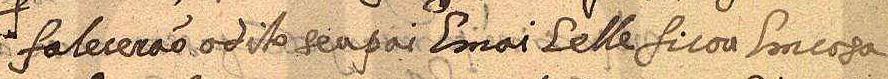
faleceraõ o dito seu pai E mai E elle ficou Em casa
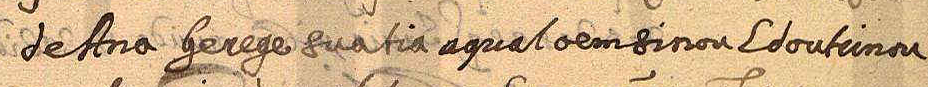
de Ana herege sua tia a qual o ensinou E doutrinou
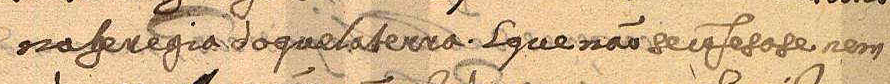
na heregia daquela terra. E que naõ se cōfesase nem
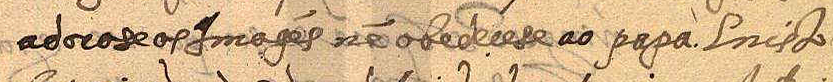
adorase as Jmagēs nē obedecese ao papa. E nisto
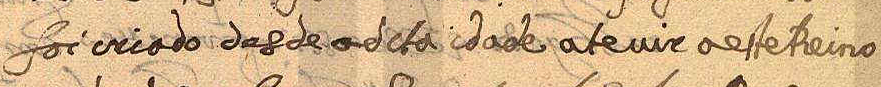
foi criado desde a dita idade ate uir a este Reino
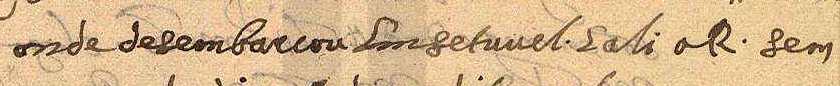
onde desembarcou Em setuuel E ali o R. sem
